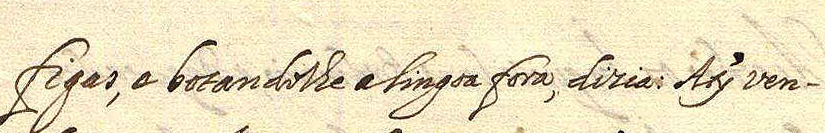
figas, e botandolhe a lingoa fora, dizia. A ty ven
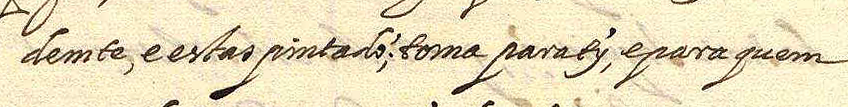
demte, e estas pintado, toma para ty, e para quem
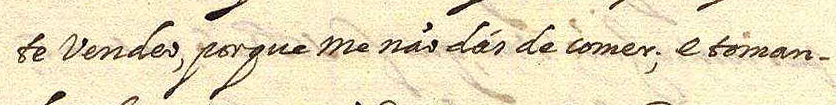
te vendeo, porque me não dás de comer, e toman
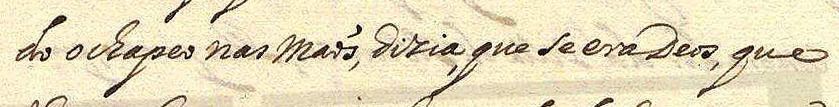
do o chapeo nas maõs, dizia, que se era Deos, que
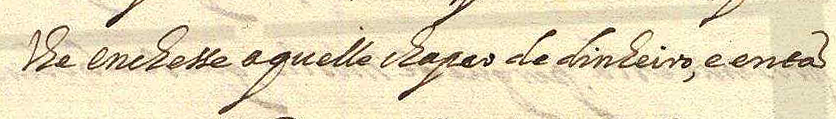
lhe enchesse aquelle chapeo de dinheiro, e entaõ
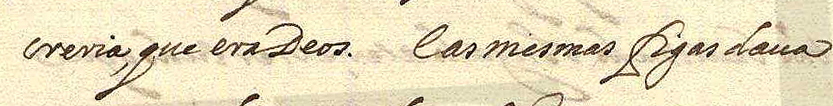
creria, que era Deos. E as mesmas figas daua
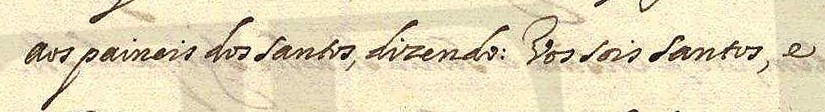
aos paineis dos santos, dizendo: Vos sois santos, e
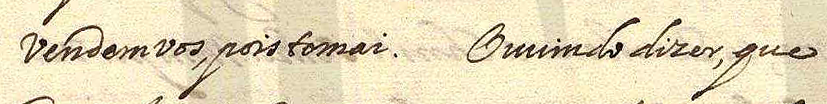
vendem vos, pois tomai. Ouuindo dizer, que
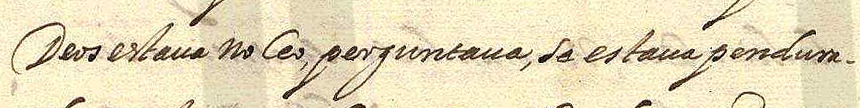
Deos estaua no Ceo, perguntaua, se estaua pendura
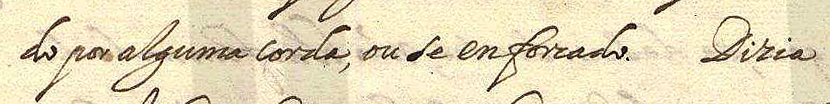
do por alguma corda, ou se enforcado. Dizia
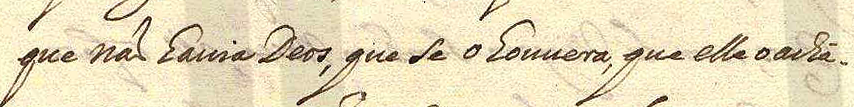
que não hauia Deos, que se o houuera, que elle o achá
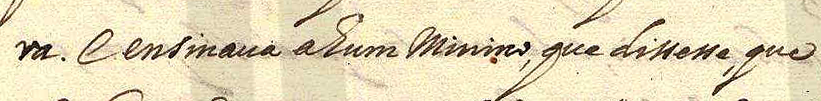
ra. E ensinaua a hum minino, que dissesse, que
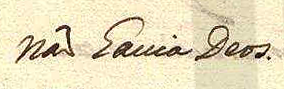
não hauia Deos.
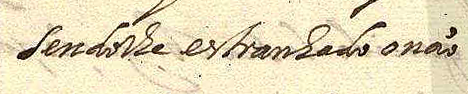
sendolhe estranhado o naõ
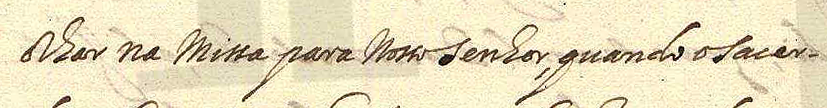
olhar na Missa para nosso senhor, quando o sacer
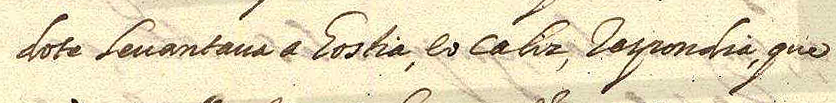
dote leuantaua a hostia, e o caliz, Respondia, que
